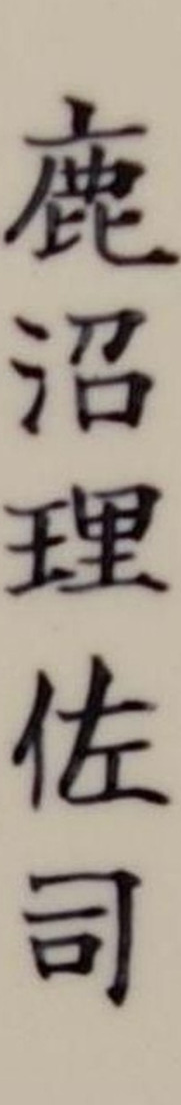鹿沼理佐司
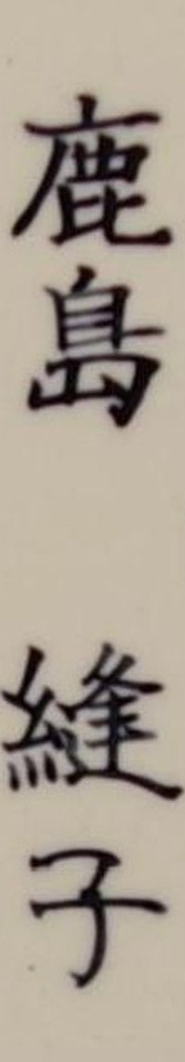鹿島縫子
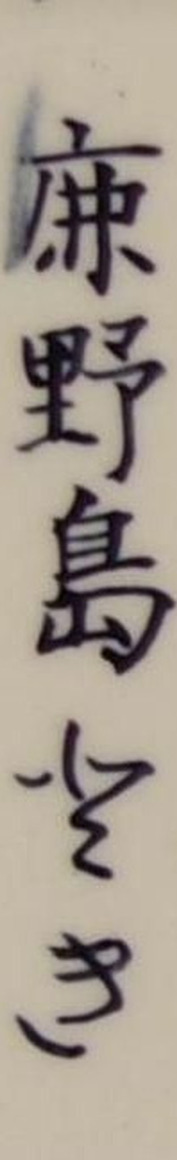鹿野島とき

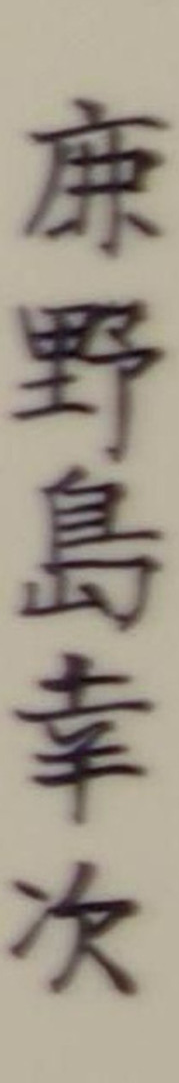廉野島幸次
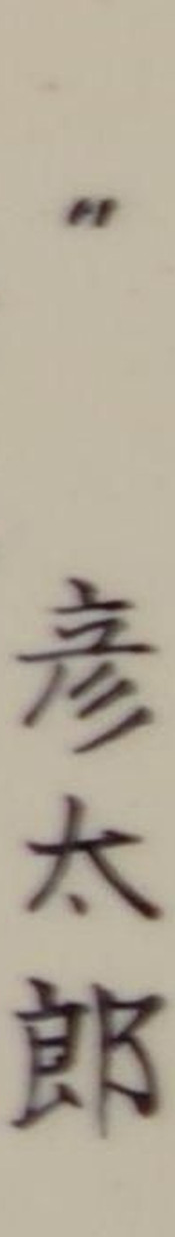彦太郎
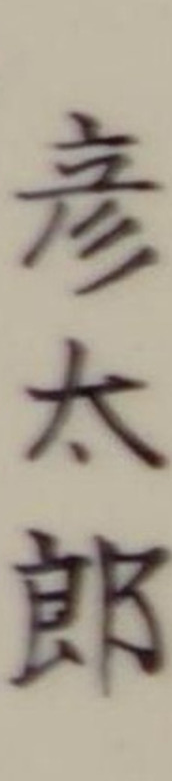彦太郎
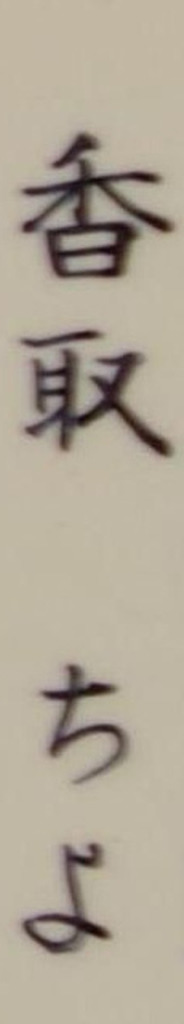香取ちよ
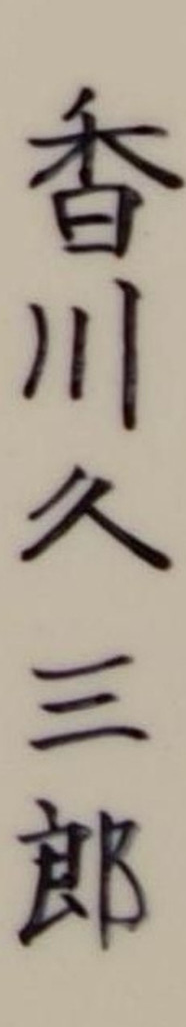香川久三郎
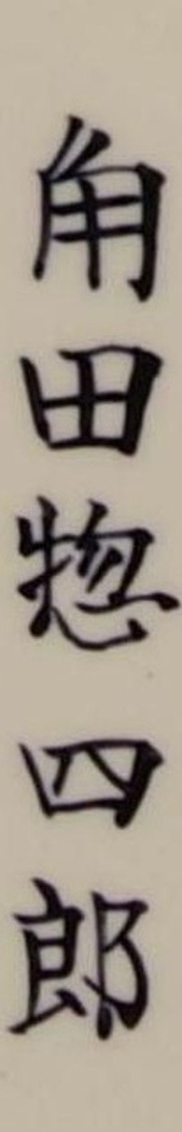角田惣四郎
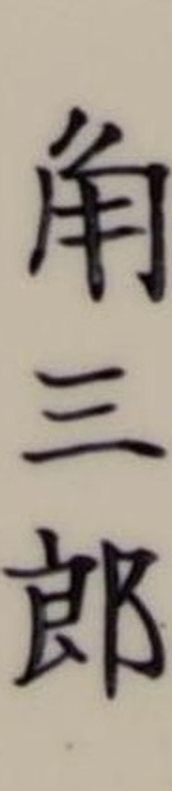角三郎

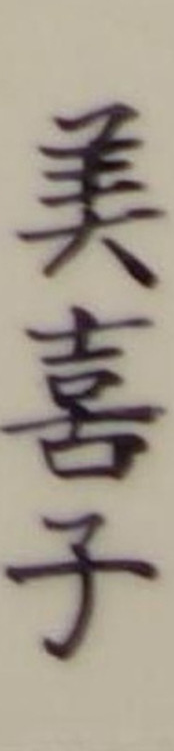美喜子
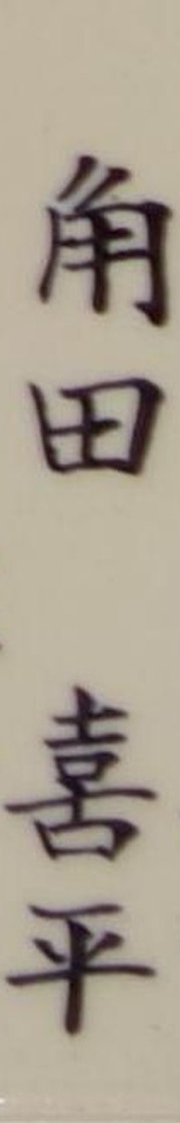角田喜平
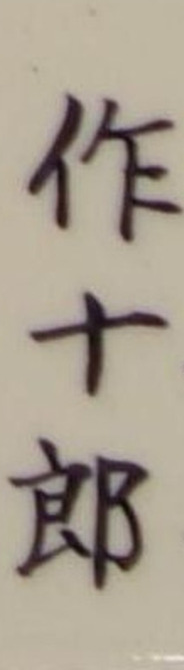作十郎
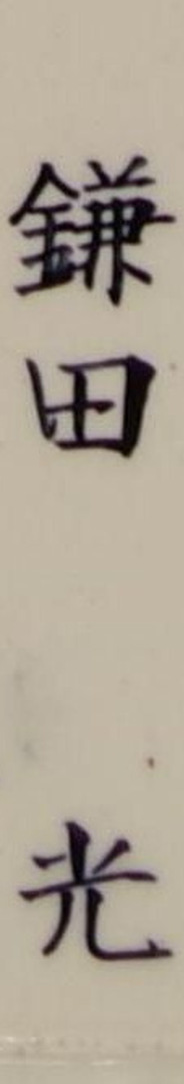鎌田光
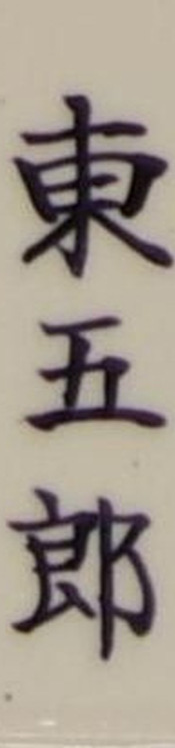東五郎

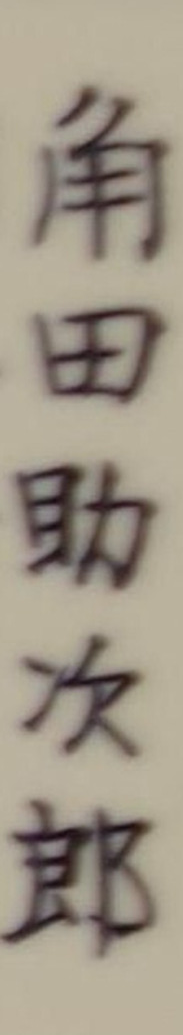角田助次郎
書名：M~S
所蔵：高野山金剛峯寺
